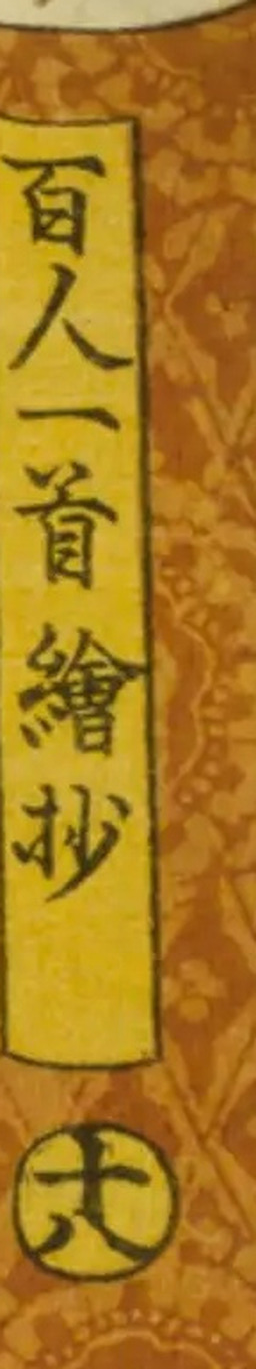百人一首絵抄十八
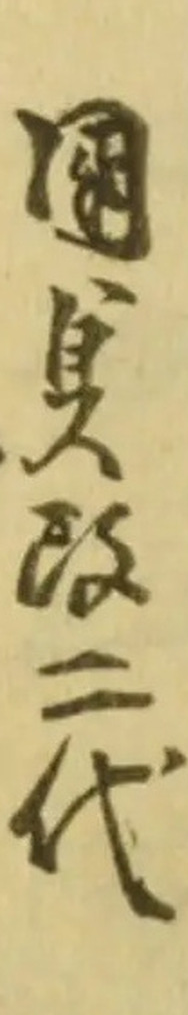国貞改二代
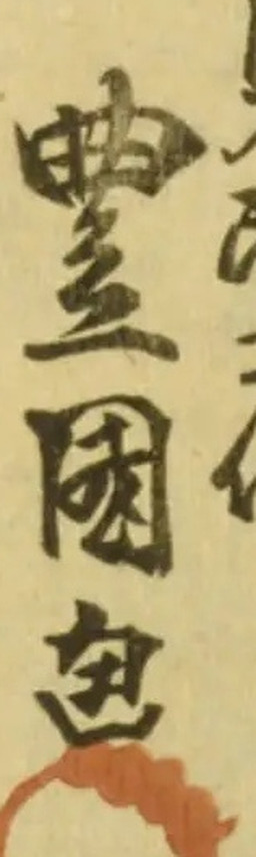豊国画
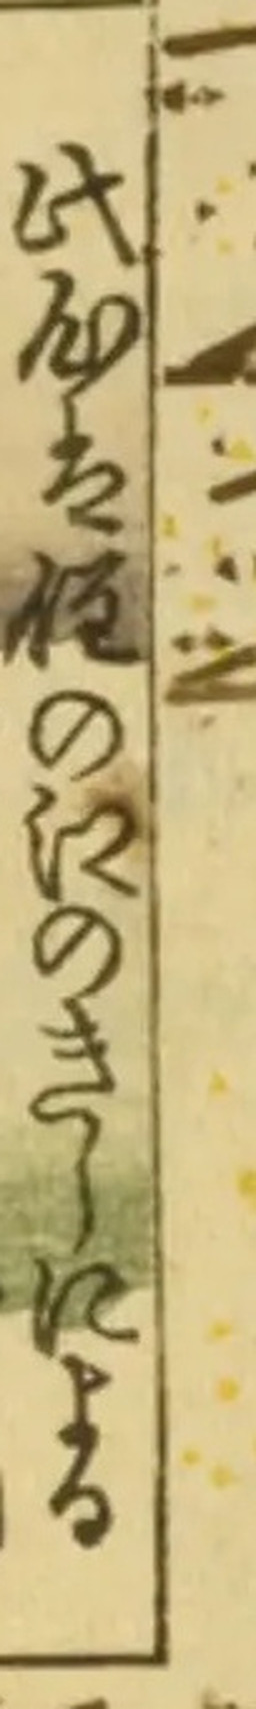此心は住の江のきしによる
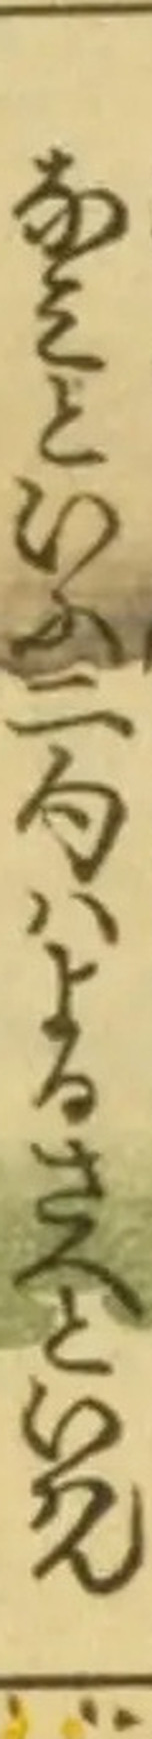なみといふ二句はよるさへといはん
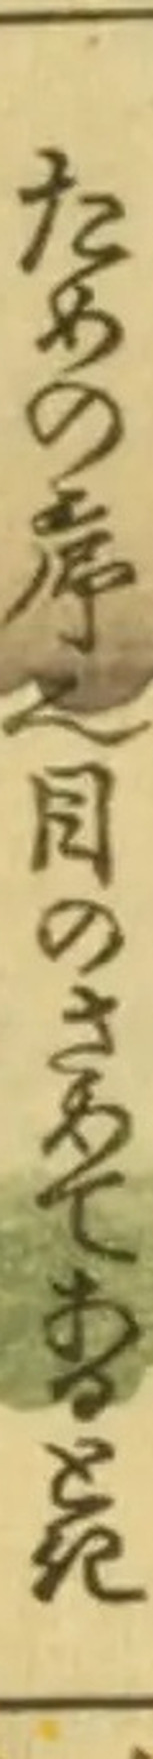ための序也目のさめてあるとき
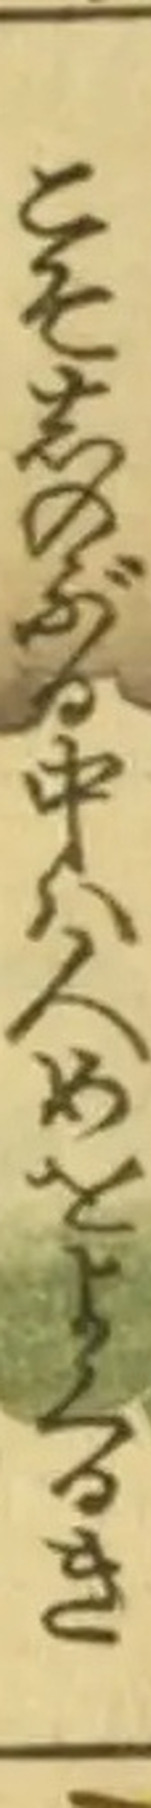こそしのぶる中は人めをよくるき
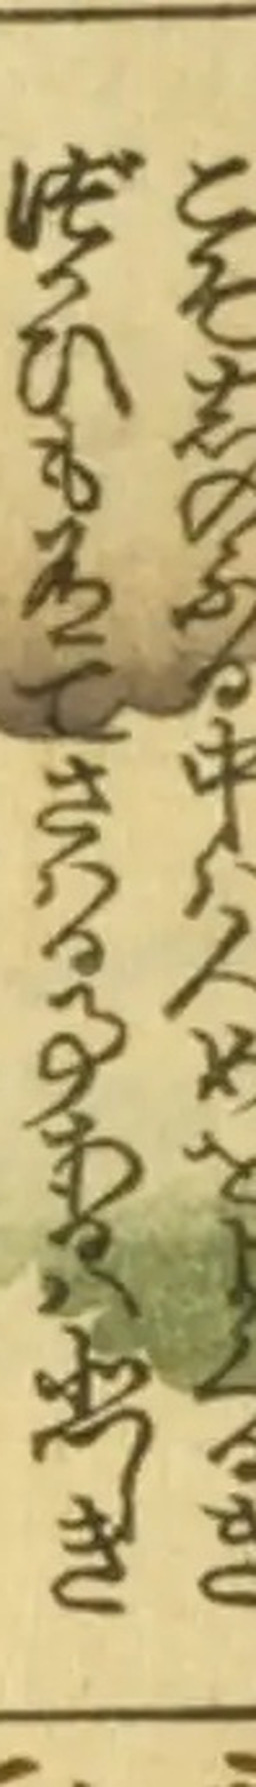づかひも有てさはる事あるは悲しき
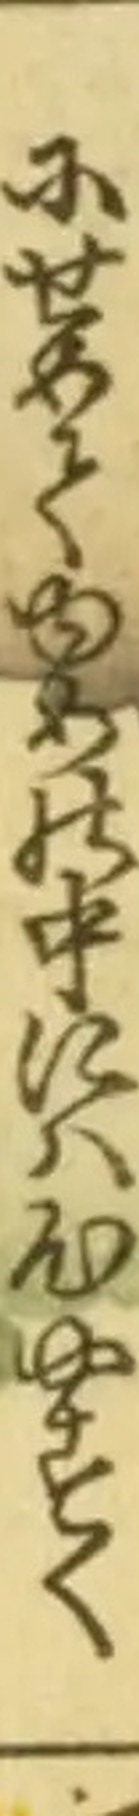にせめてゆめの中には心やすく
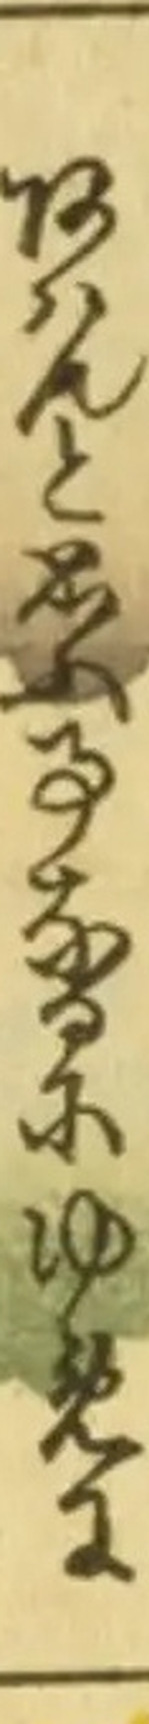あはんとおも思ふ事なるにゆめに
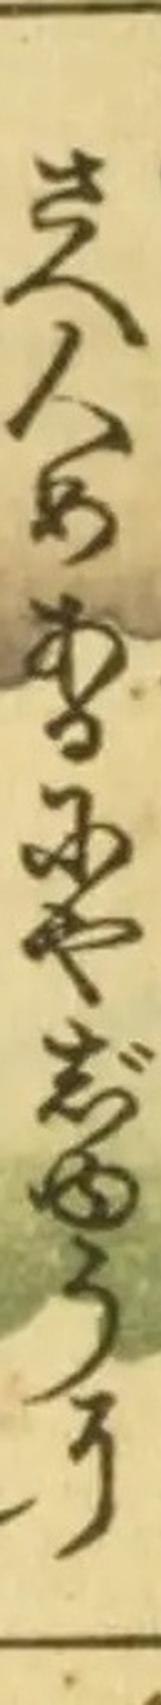さへ人めあるにやじゆうに
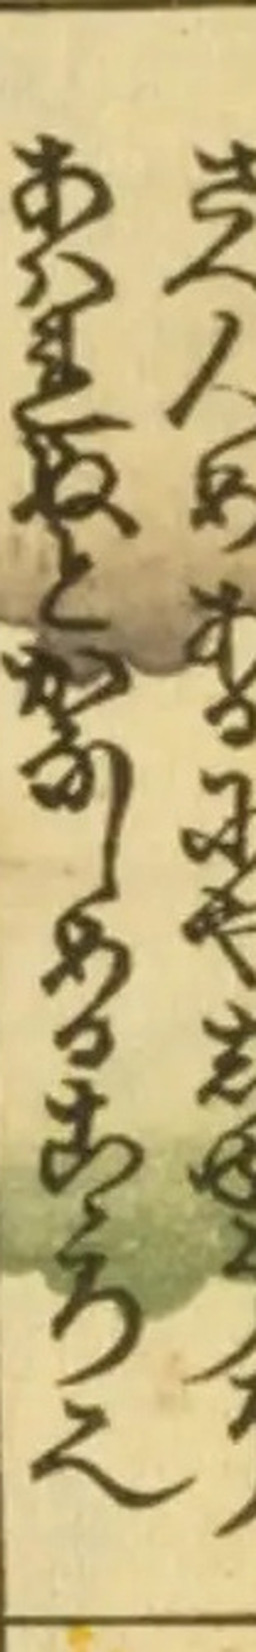あはれぬとかなしめるこゝろ也
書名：百人一首絵抄　十八　藤原敏行朝臣
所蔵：国立国会図書館 National Diet Library, JAPAN
